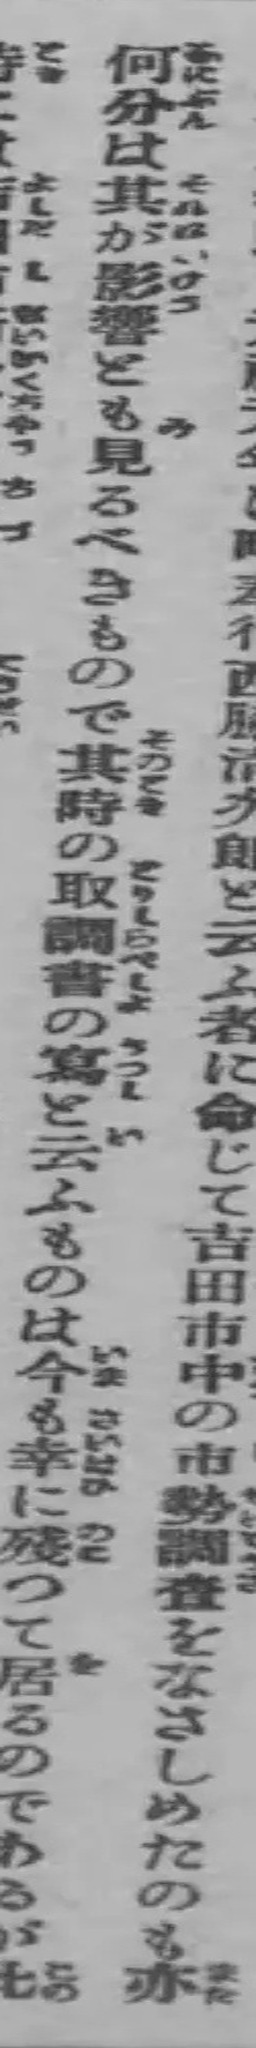何分は其が影響とも見るべきもので其時の取調書の写と云ふものは今も幸に残つて居るのであるが此
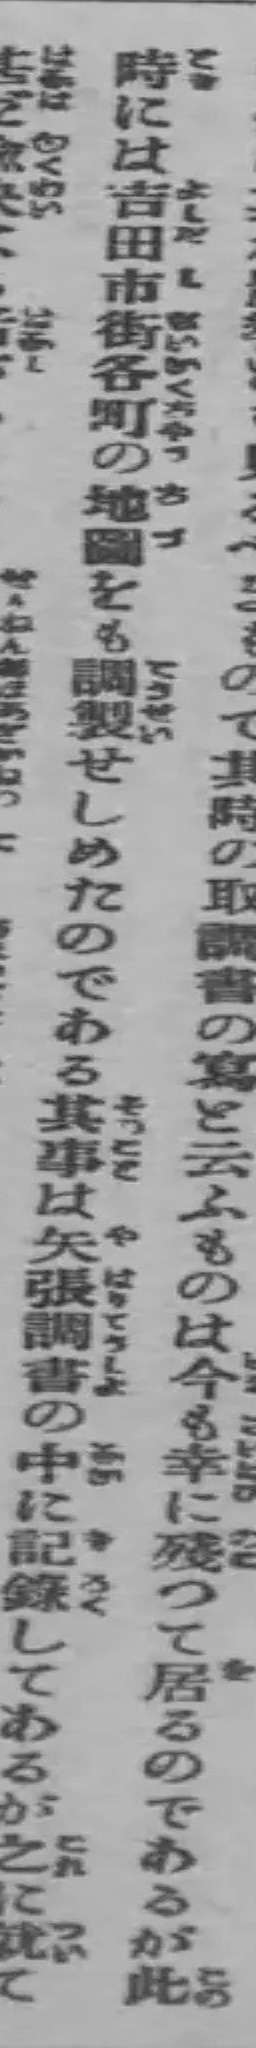時には吉田市街各町の地図をも調製せしめたのである其事は矢張調書の中に記録してあるが之に就て
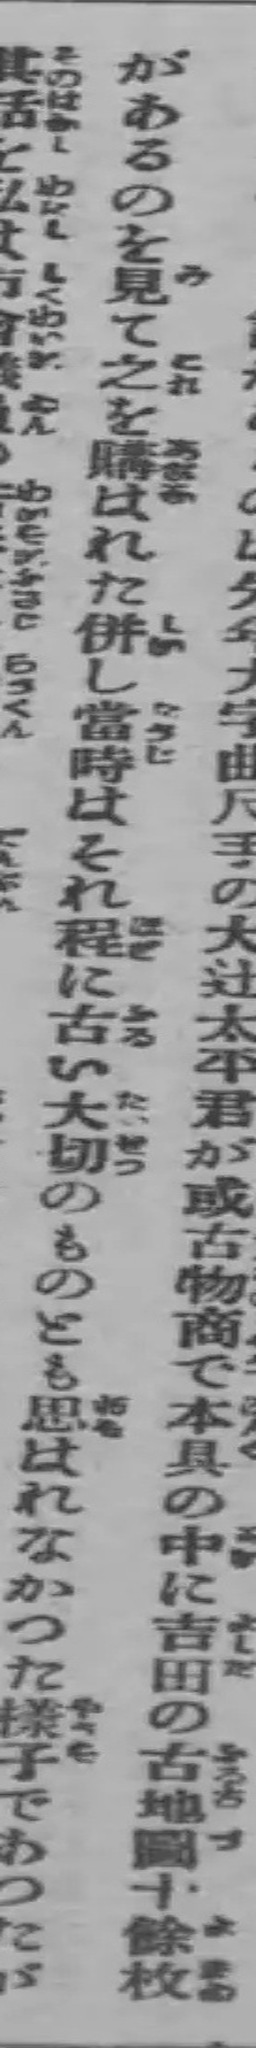があるのを見て之を購はれた併し当時はそれ程古い大切のものと思はれなかつた様子であつたが
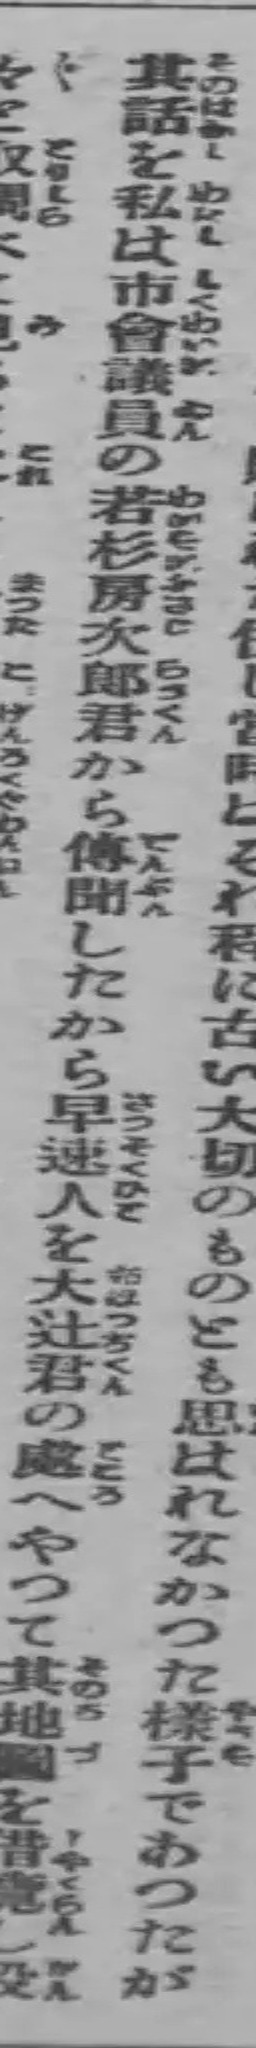其話を私は市会議員の若杉房次郎君から伝聞したから早速人を大辻君の処へやつて其地図を借覧し段
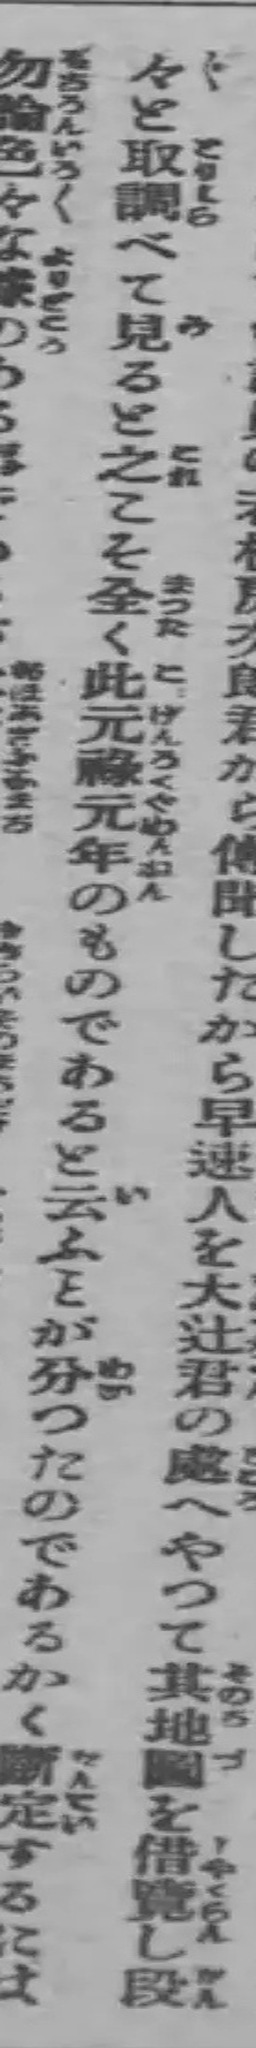段と取調べて見ると之こそ全く此元禄元年のものであると云ふことが分つたのであるかく断定するには
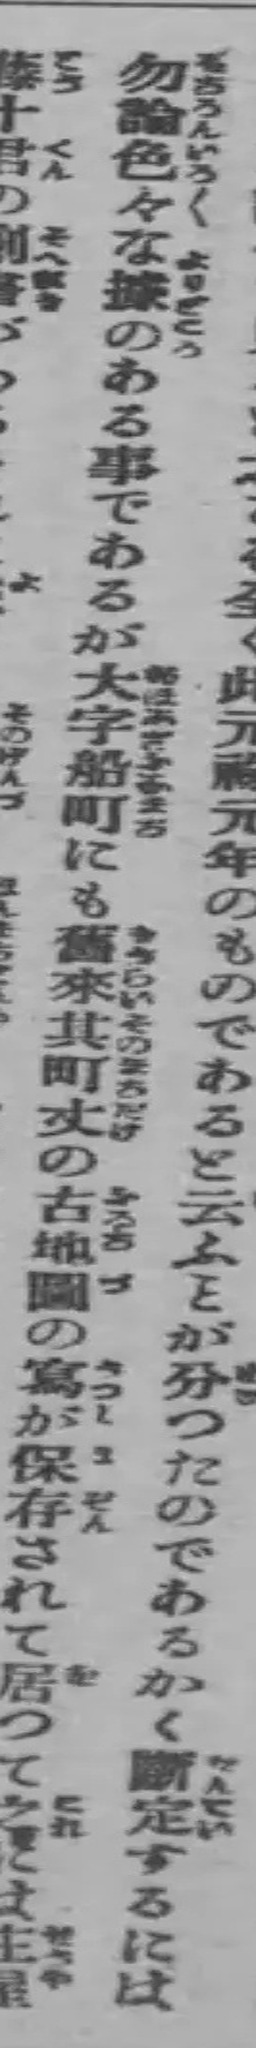勿論色々な拠のある事であるが大字船町にも旧来其町丈の古地図の写が保存されて居つて之には庄屋
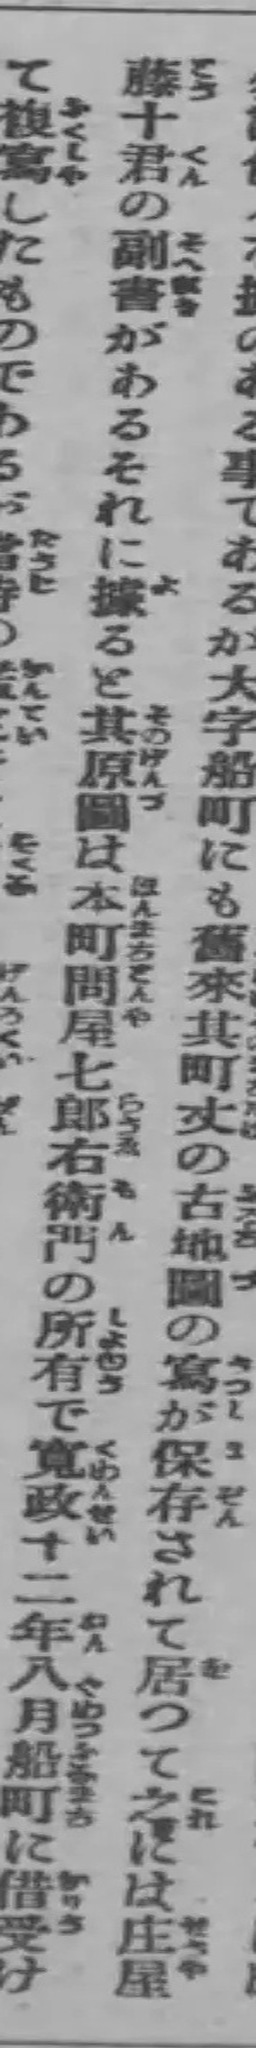藤十君の副書があるそれに拠ると其原図は本町問屋七郎右衛門の所有で寛政十二年八月船町に借受け
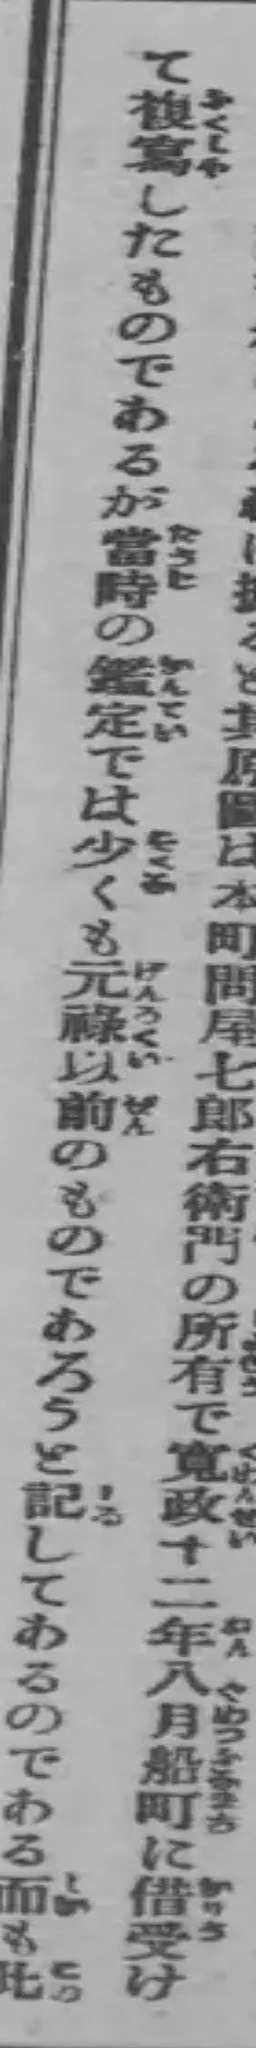て複写したものであるが当時の鑑定では少くも元禄以前のものであろうと記してあるのである而も此
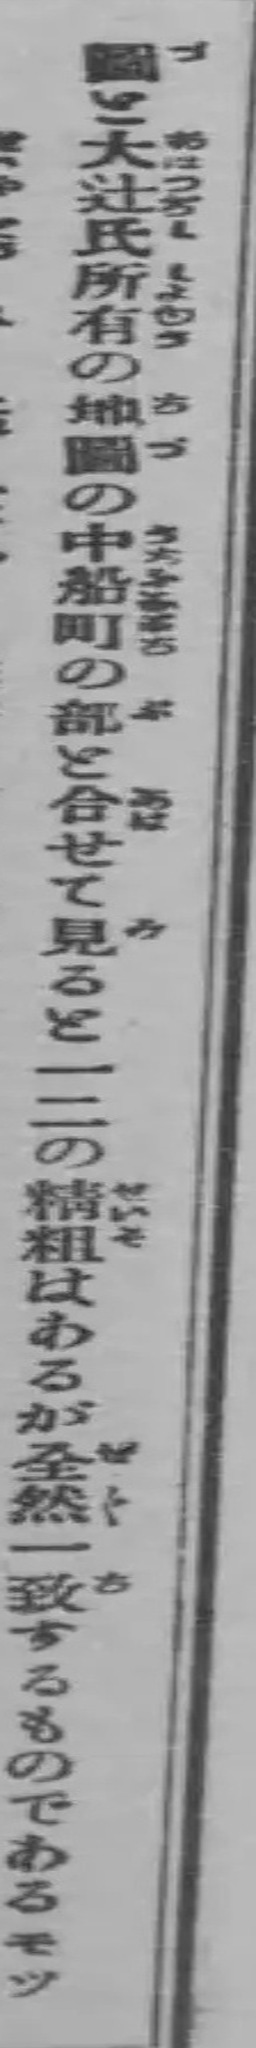図と大辻氏所有の地図の中船町の部と合せて見ると一二の精粗はあるが全然一致するものであるモツ
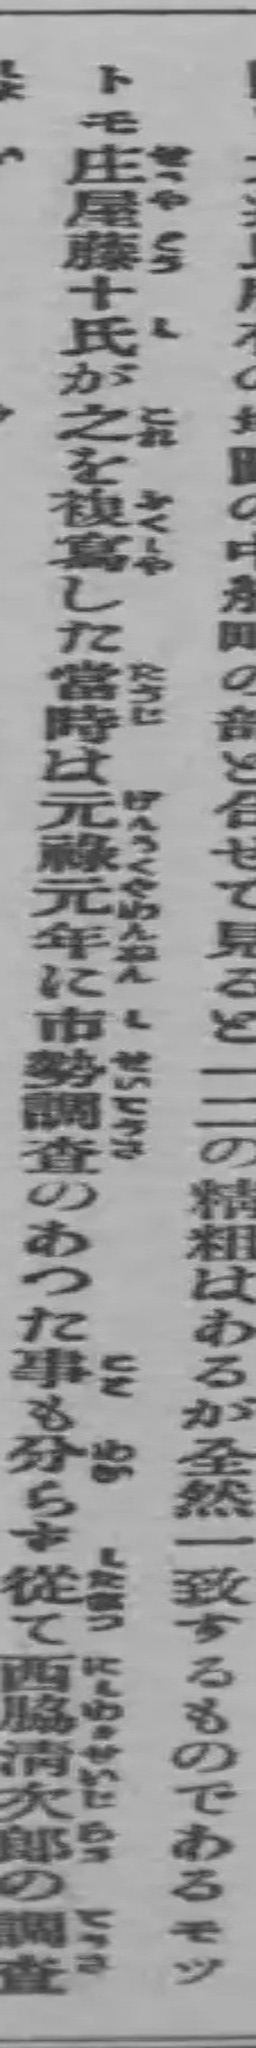トモ庄屋藤十氏が之を複写した当時は元禄元年に市勢調査のあつた事も分らず従て西脇清次郎の調査
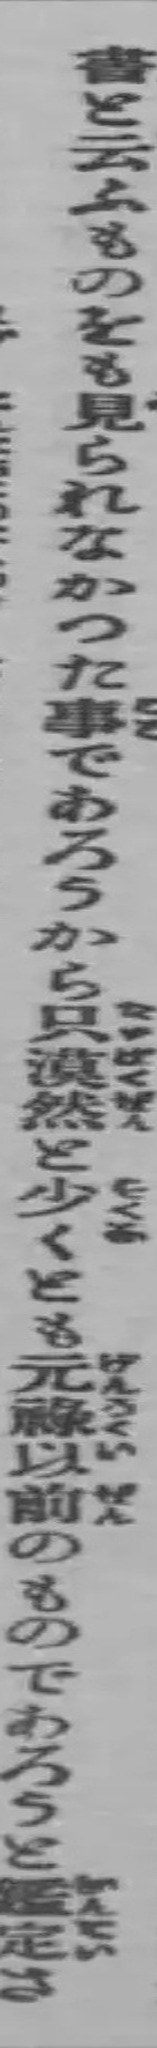書と云ふものをも見られなかつた事であろうから只漠然と少くとも元禄以前のものであろうと鑑定さ
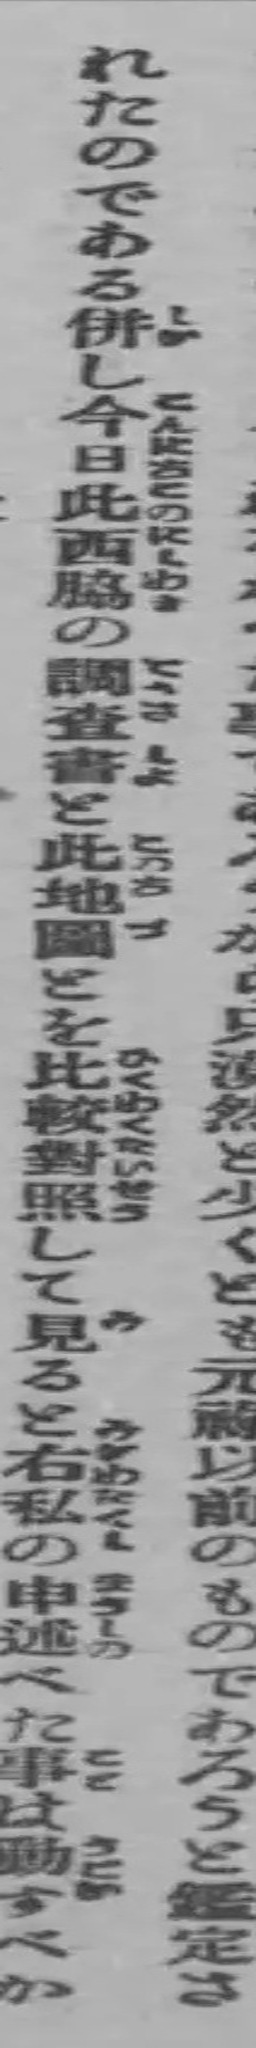れたのである併し今日此西脇の調査書と此地図とを比較対照して見ると右私の申述べた事は動すべか
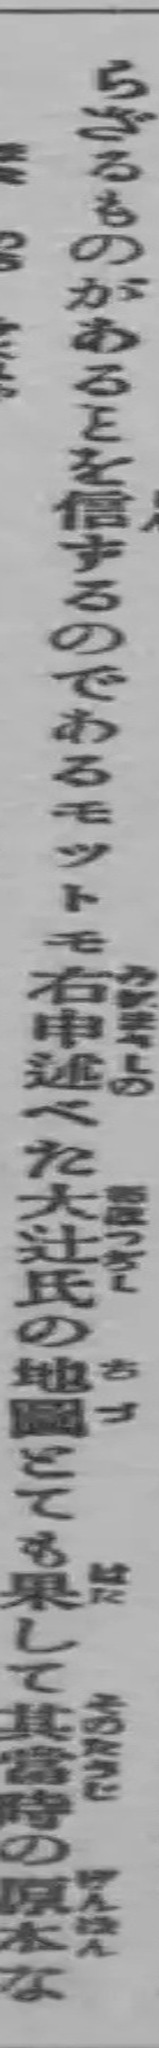らざるものがあることを信ずるのであるモツトモ右申述べた大辻氏の地図とても果して其当時の原本な
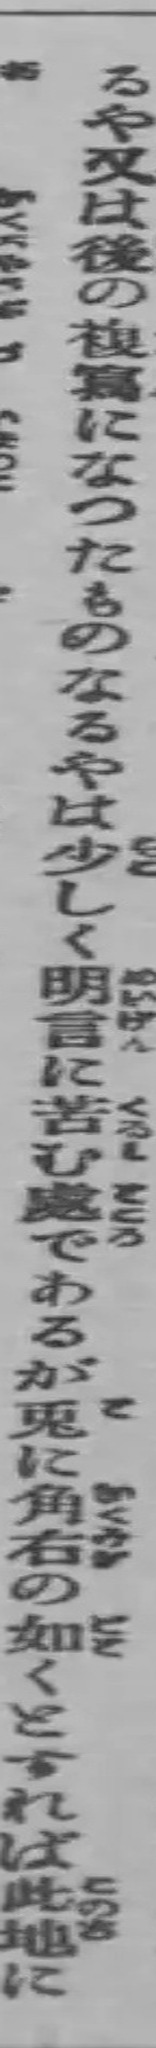るや又は後の複写になつたものなるやは少しく明言に苦む処であるが兎に角右の如くとすれば此地に
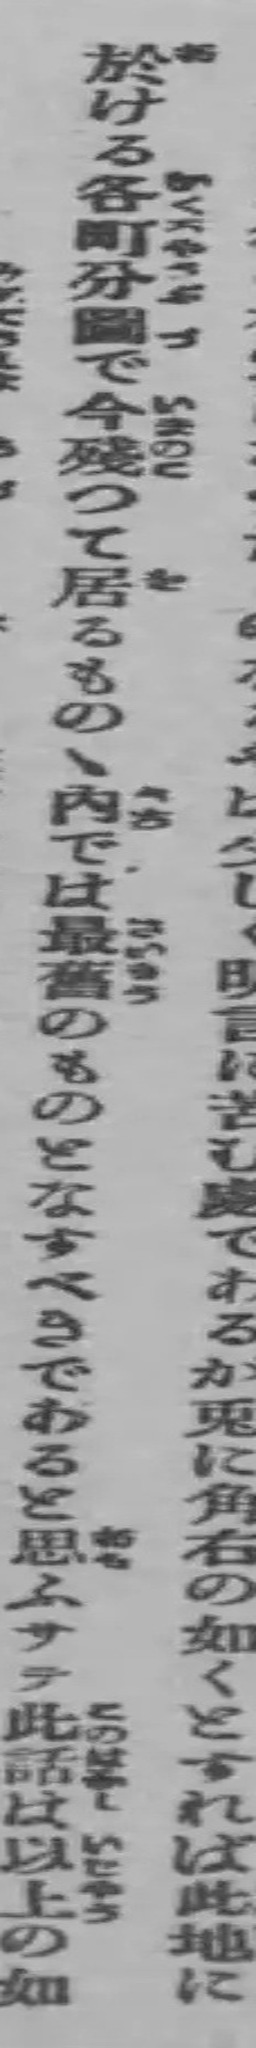於ける各町分図で今残つて居るものゝ内では最旧のものとなすべきであると思ふサテ此話は以上の如
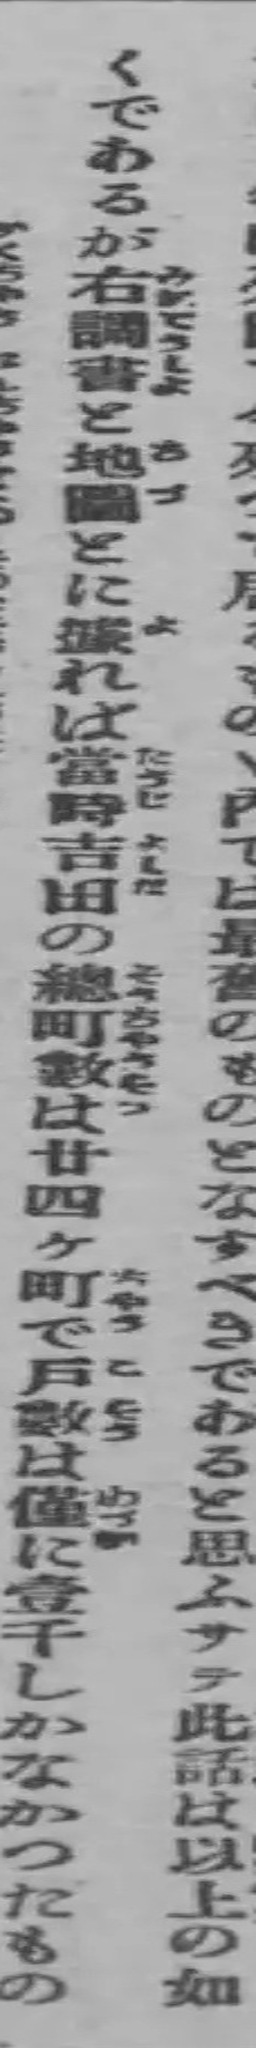くであるが右調書と地図とに拠れば当時吉田の総町数は廿四ケ町で戸数は僅に壱千しかなかつたもの
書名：豊橋市史談
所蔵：国立国会図書館 National Diet Library, JAPAN
